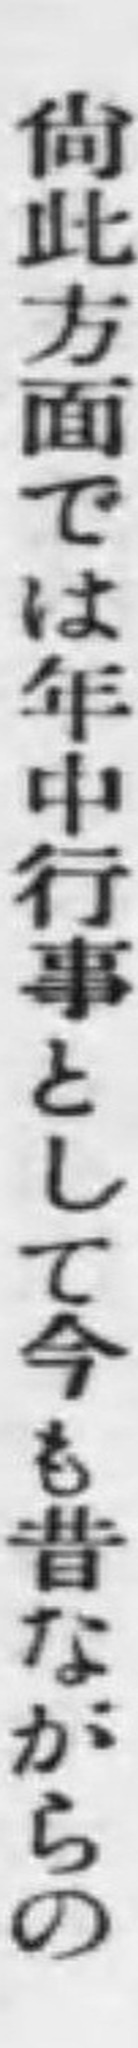尚此方面では年中行事として今も昔ながらの
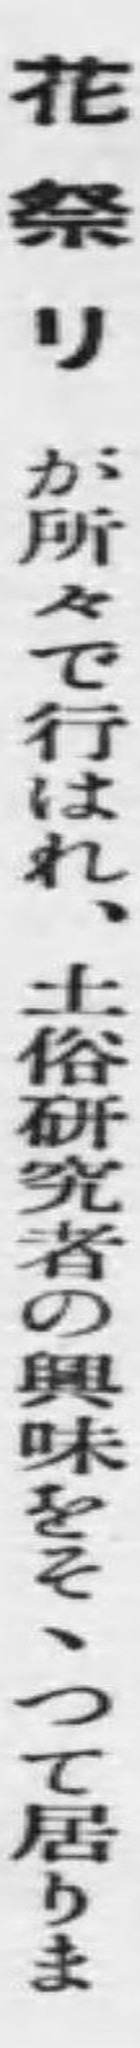花祭りが所々で行はれ、土俗研究者の興味をそヽつて居りま
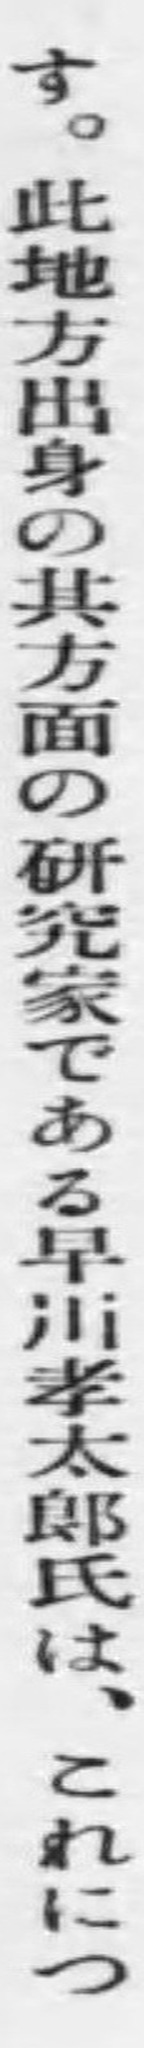す。此地方出身の其方面の研究家である早川孝太郎氏は、これにつ
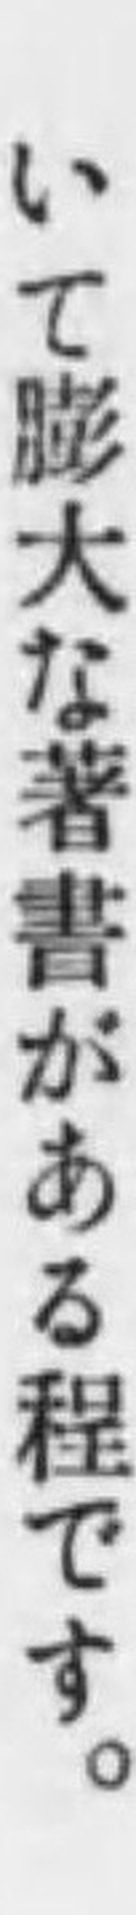いて膨大な著書がある程です。
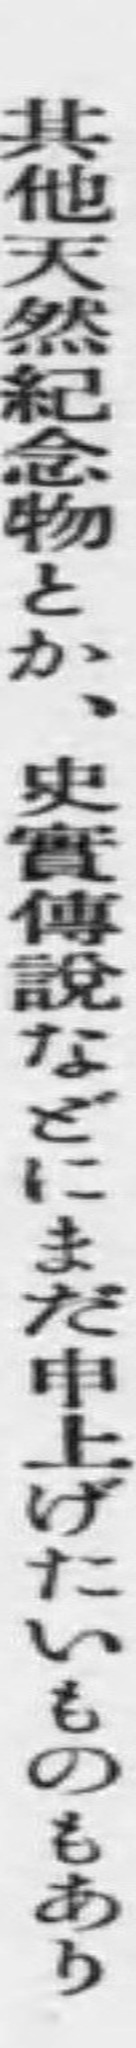其他天然紀念物とか、史實傳説などにまだ申上げたいものもあり
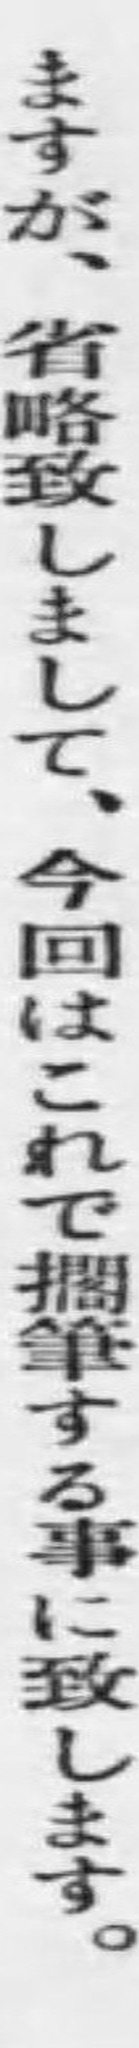ますが、省略致しまして、今回はこれで擱筆する事に致します。
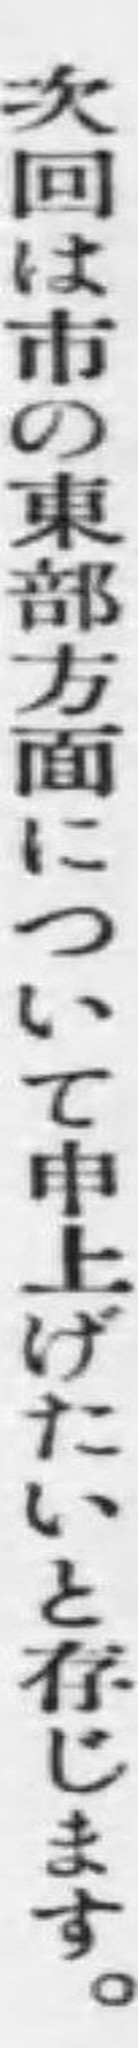次回は市の東部方面について申上げたいと存じます。敬具

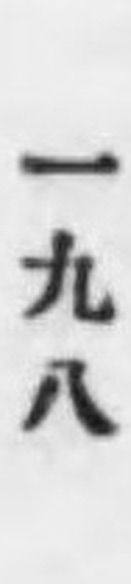一九八
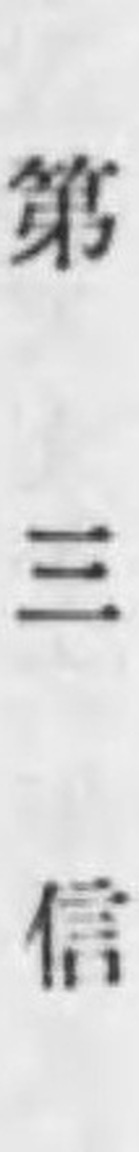第三信
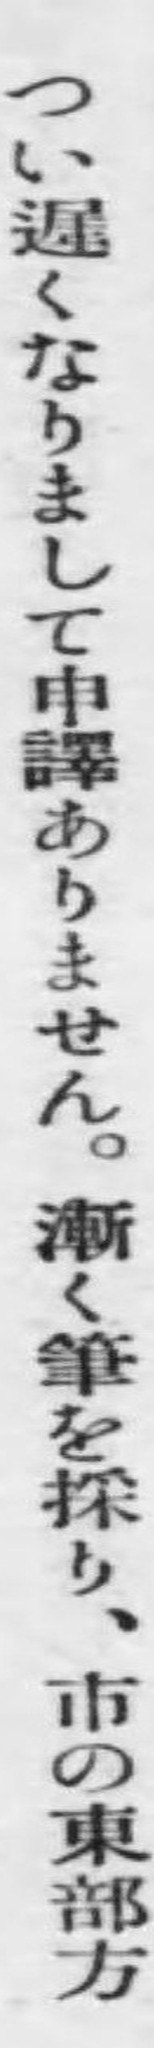つい遅くなりまして申訳ありません。漸く筆を採り、市の東部方
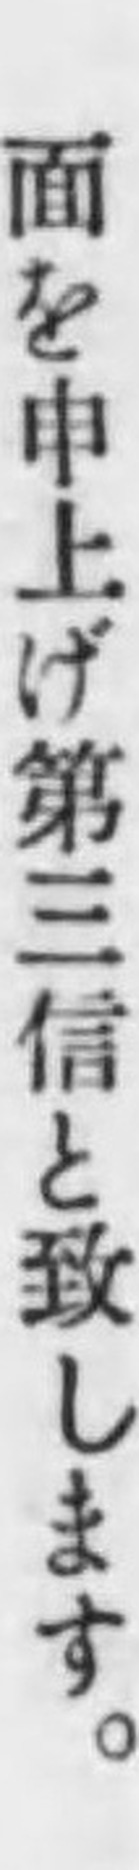面を申上げ第三信と致します。
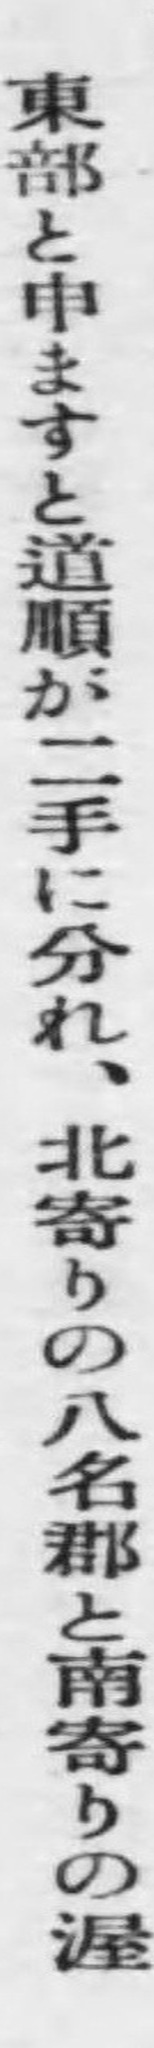東部と申ますと道順が二手に分れ、北寄りの八名郡と南寄りの渥
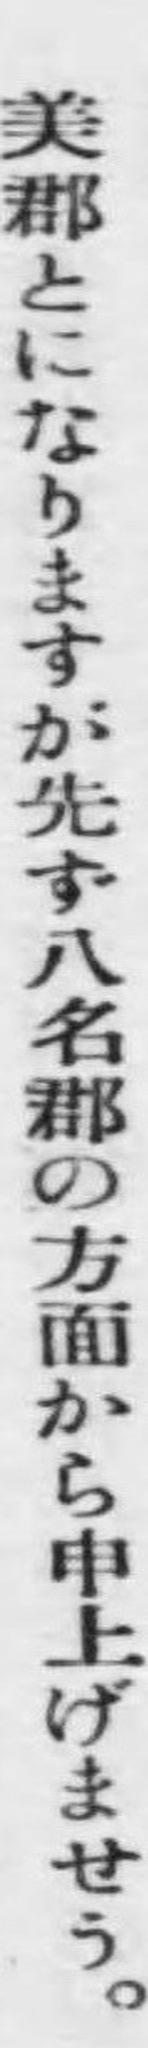美郡とになりますが先ず八名郡の方面から申上げませう。
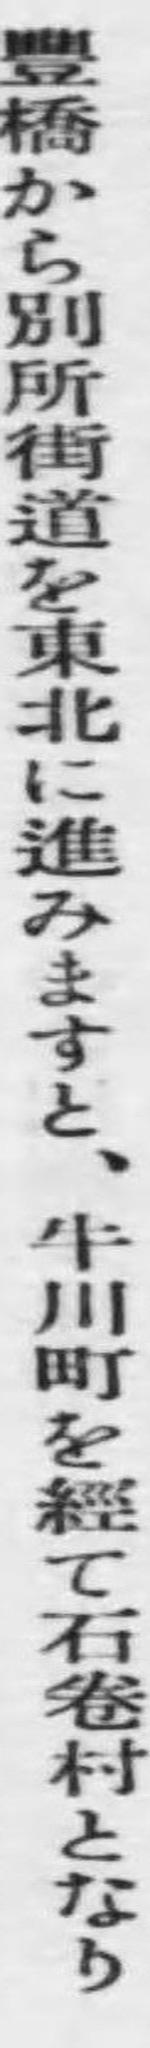豊橋から別所街道を東北に進みますと、牛川町を経て石巻村となり
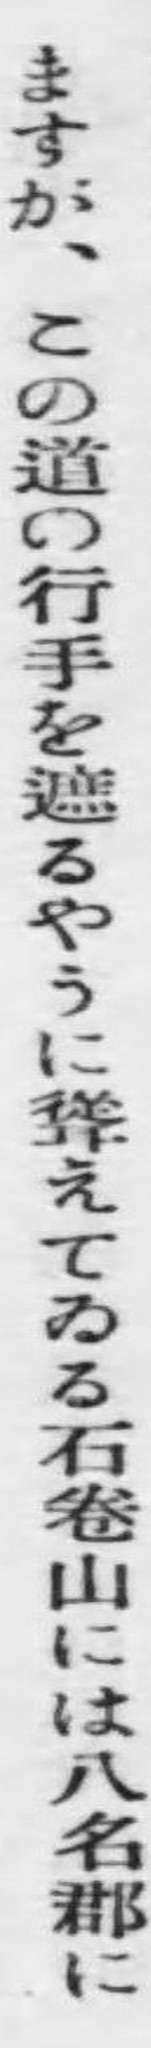ますが、この道の行手を遮るやうに聳えてゐる石巻山には八名郡に
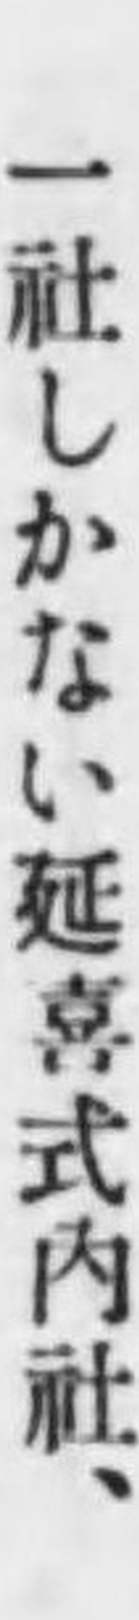一社しかない延喜式内社、
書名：東三河道中記 : 豊橋市及其附近案内
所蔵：国立国会図書館 National Diet Library, JAPAN
